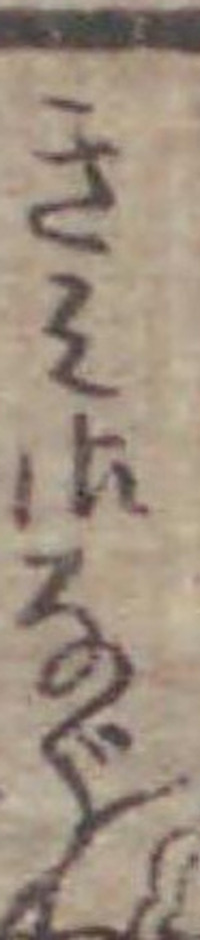きみ御なぐ
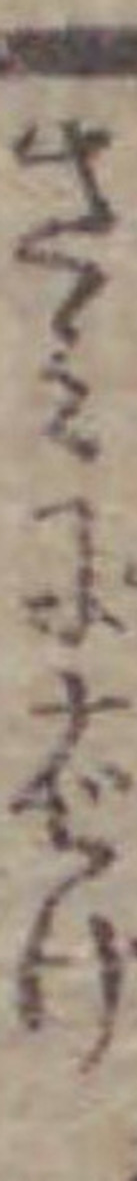さみにばけ
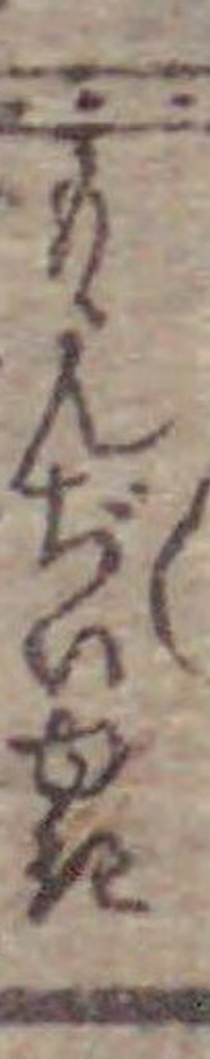もゝんぢいゆき
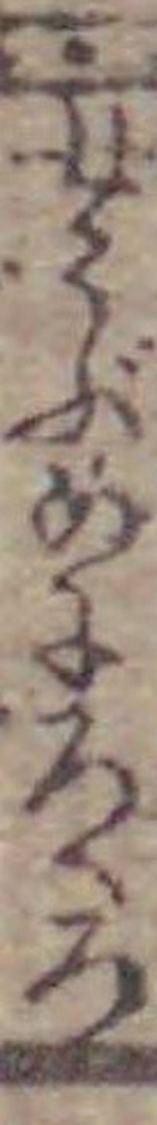女うぶめにろくろ
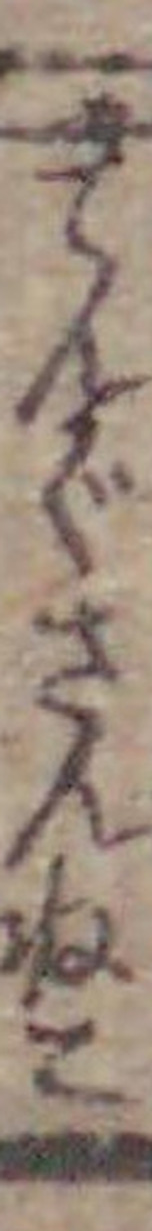てんぐさんねこ
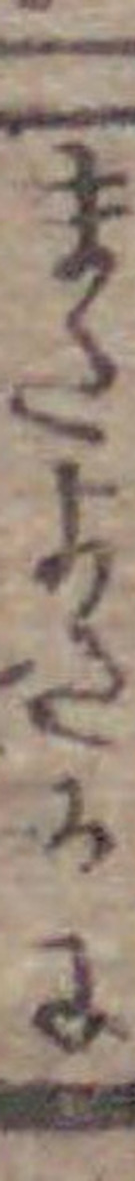またよたかに
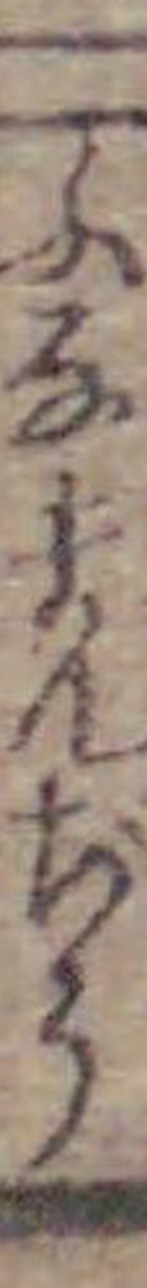ふなまんぢう
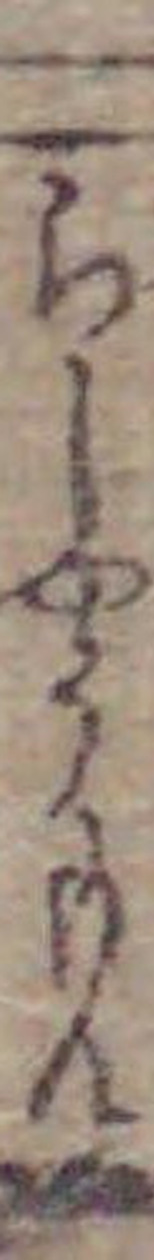らしやうもん
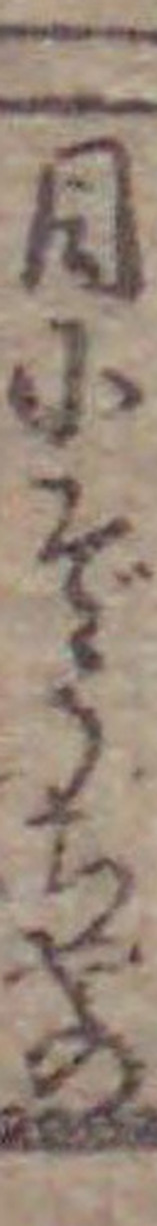目小ぞうちやの
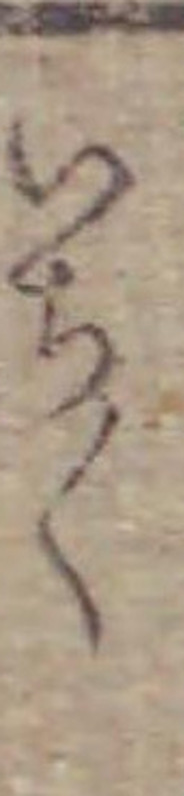いち〳〵
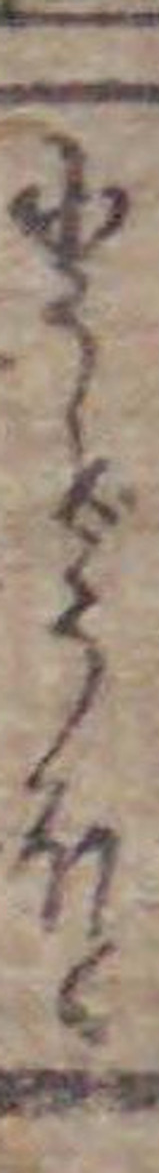にうどうほと
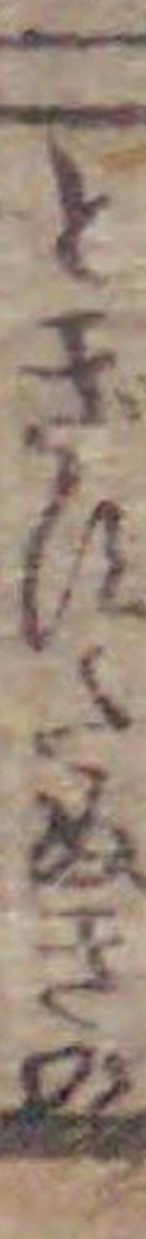とぎすたぬきの
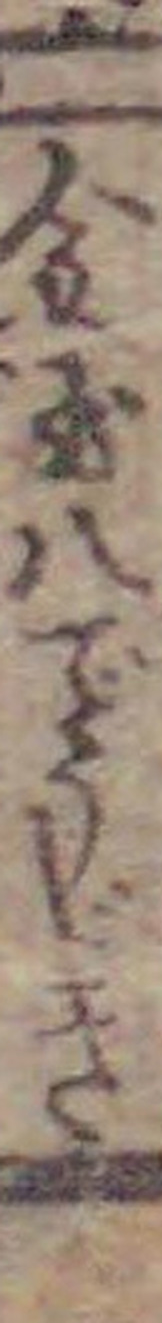金玉八でうじき
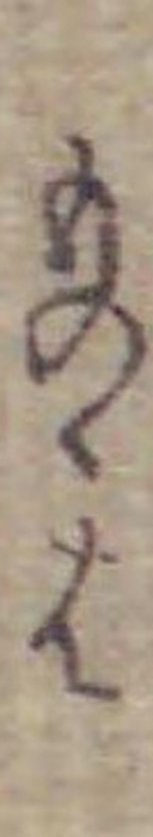ものゝは
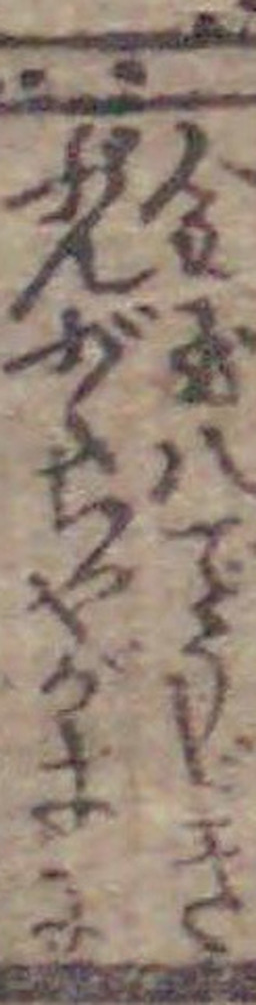ぶんぶくちやがまに
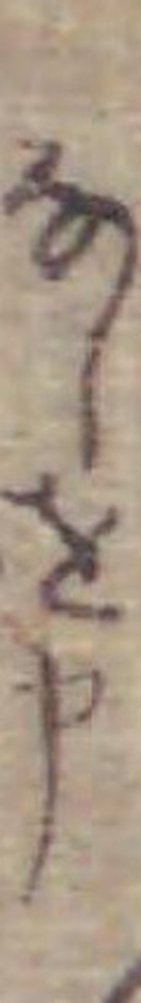なしを申
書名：二日替 : 2巻
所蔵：国立国会図書館 National Diet Library, JAPAN
